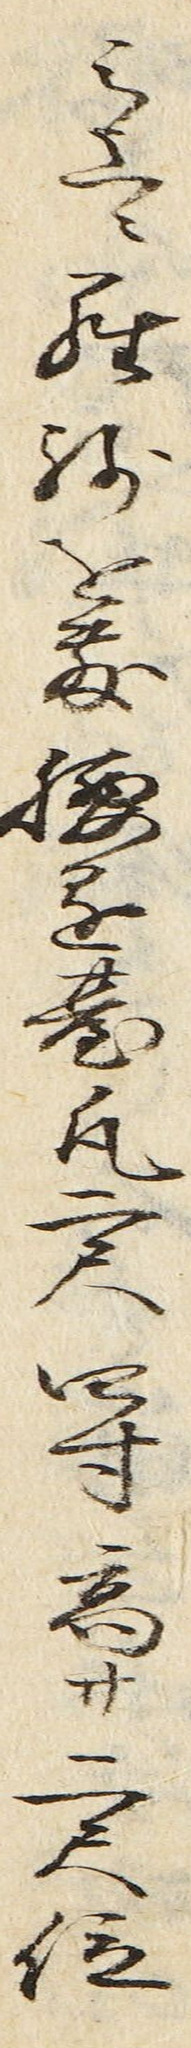之上に羅紗を敷腰懸台凡二尺四寸高さ二尺位
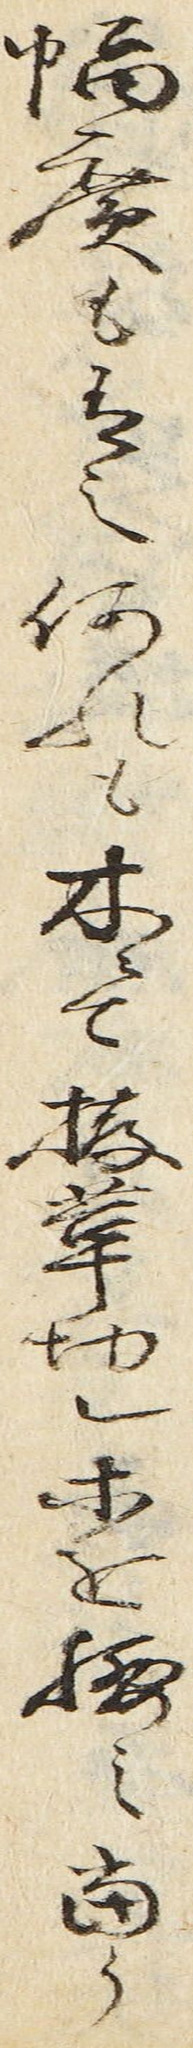幅広も有之何れも木にて拵皮切れ等を輿之当り

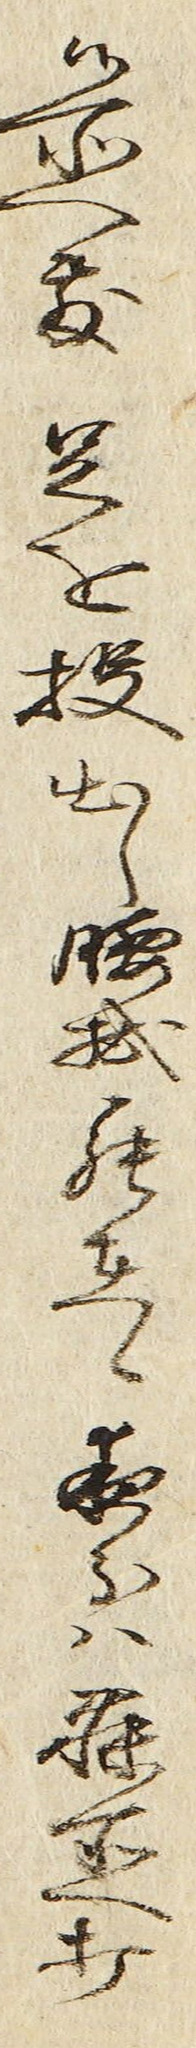候所へ敷足を投出し腰掛罷在候夜分は寝所へ打
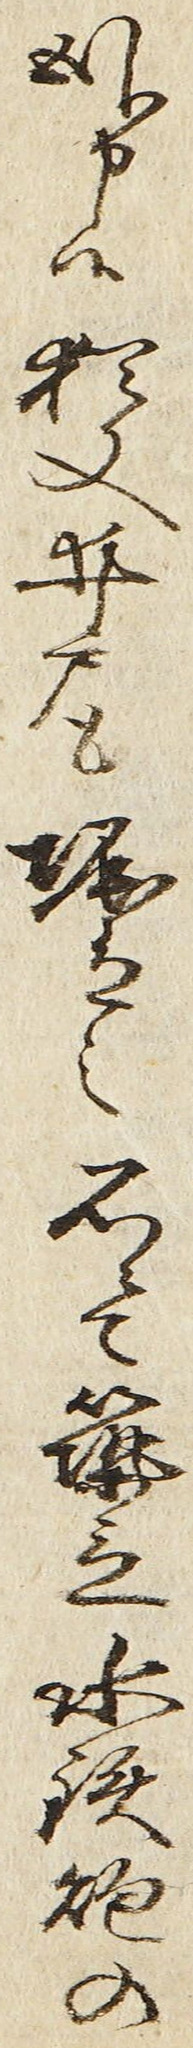臥申候猶又井戸も堀有之石にて築立水鉄砲の
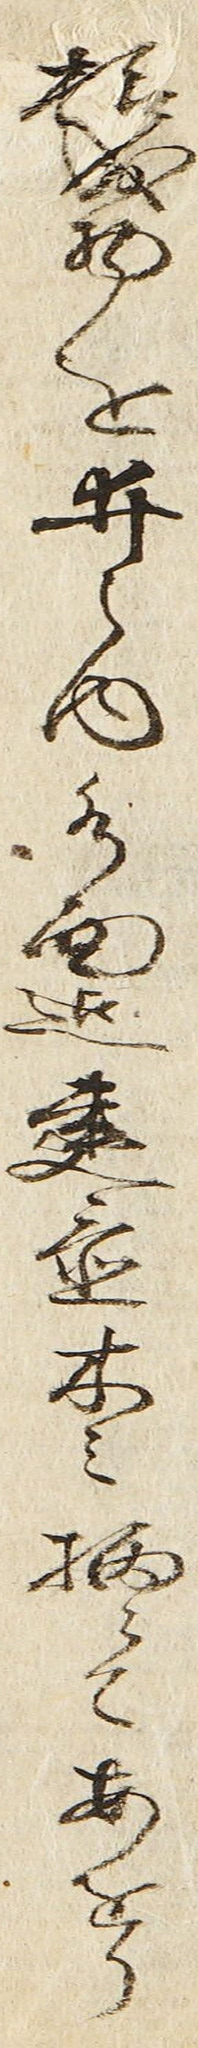様成物を井ノ内水面迄建置木之柄にてあをり
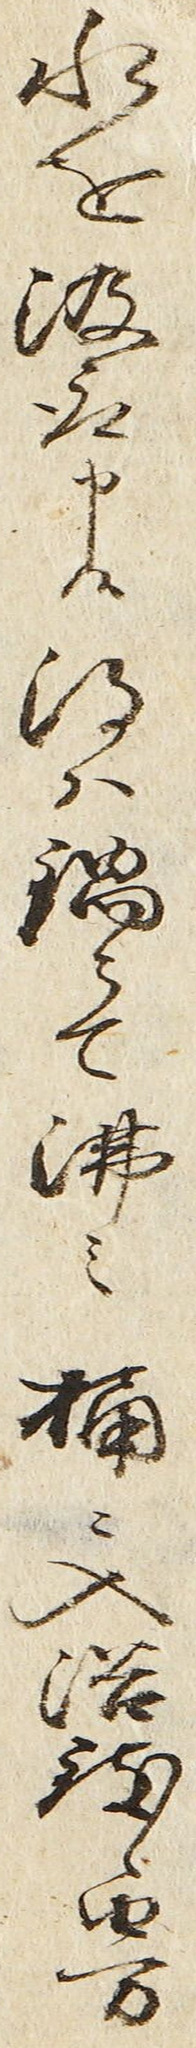水を汲取申候得は鍋にて沸之桶に入浴致候由万
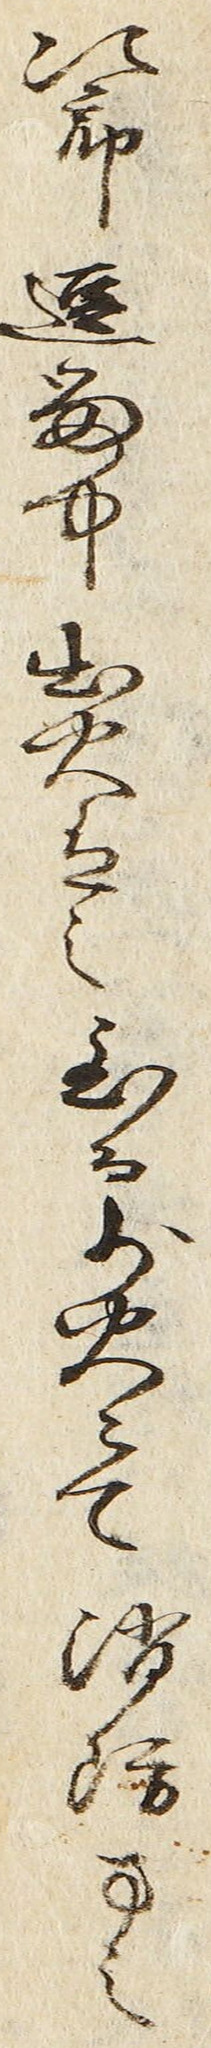次郎逗留中出火有之至而少火にて消防方之
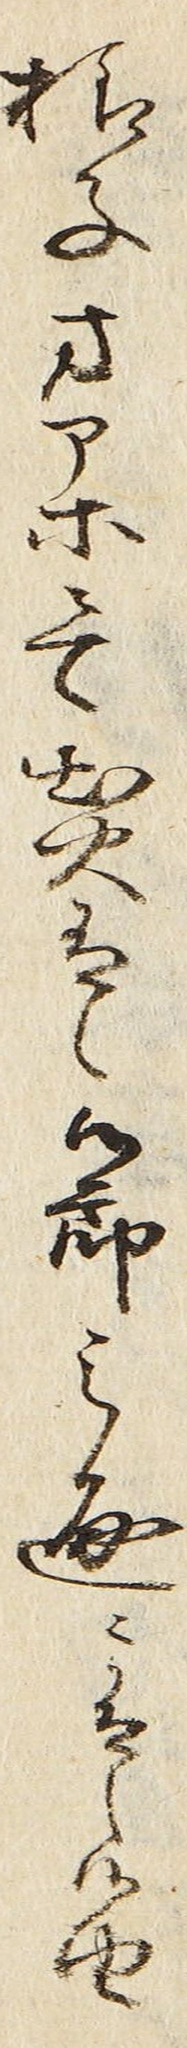様子オアホにて出火有之候節之通に有之候由
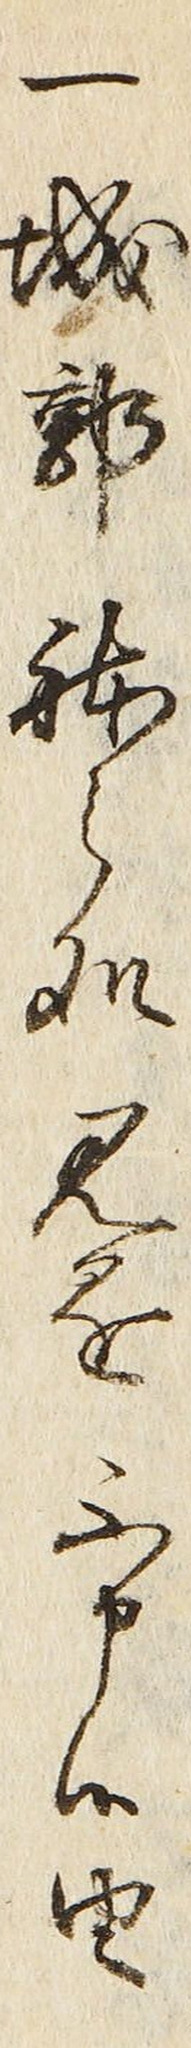一城郭躰之処見懸不申候由
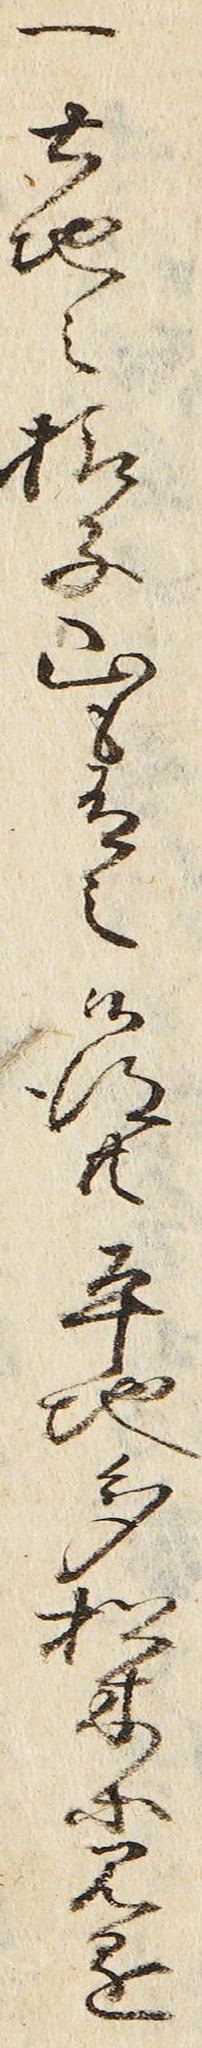一土地之様子山も有之候得共平地多松木等見懸
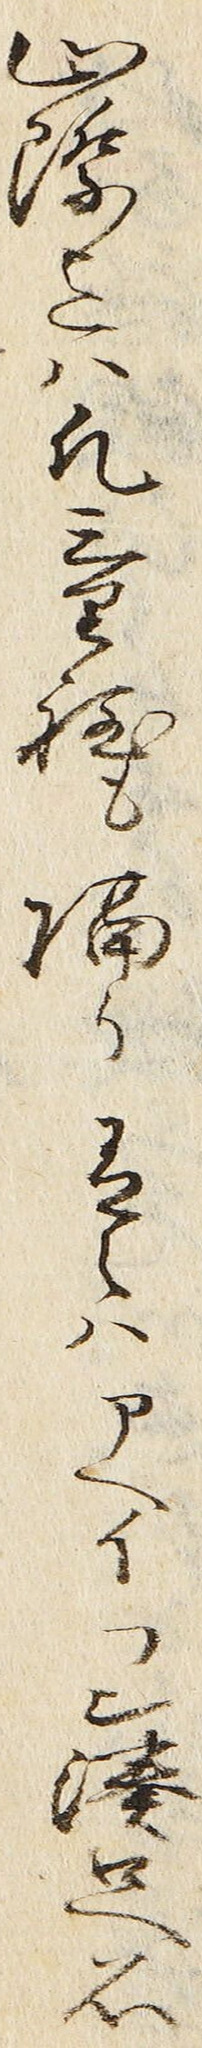山際迄は凡三里程も隔り有之ハアヘイフン湊口へ石
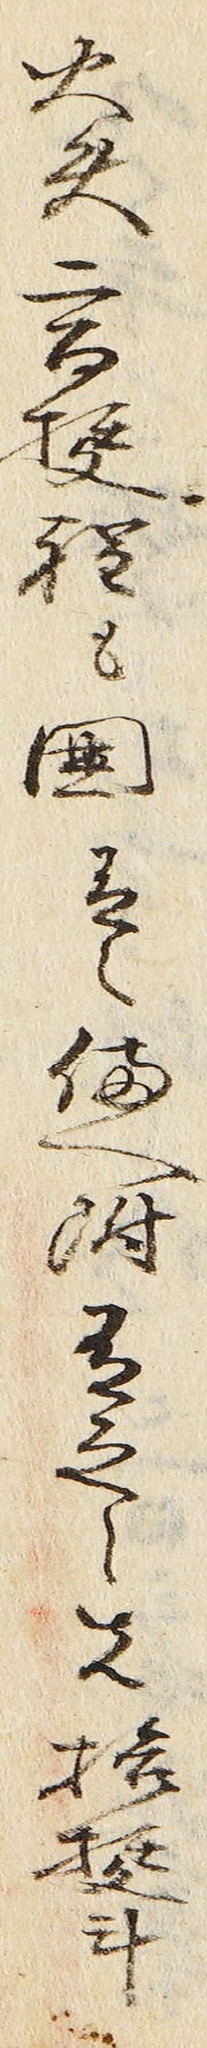火矢二百挺程も囲有之備へ附有之し先拾挺計
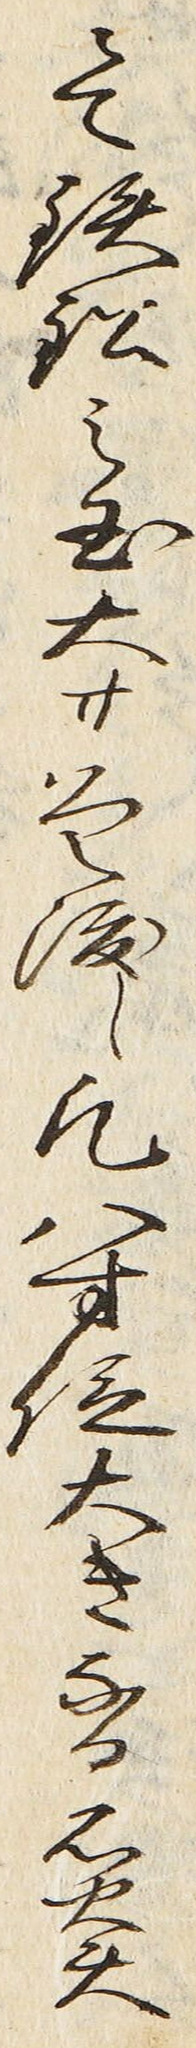にて鉄鉛之玉大さ差渡し凡八寸位大きなる石火矢
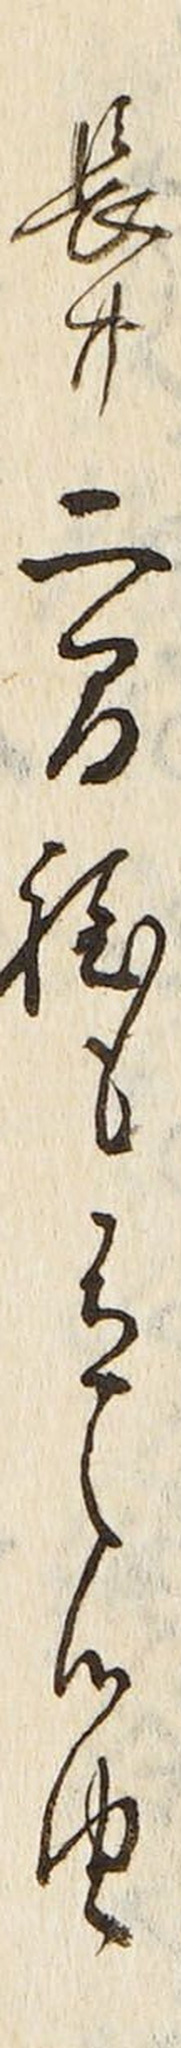長さ二間程も有之候由
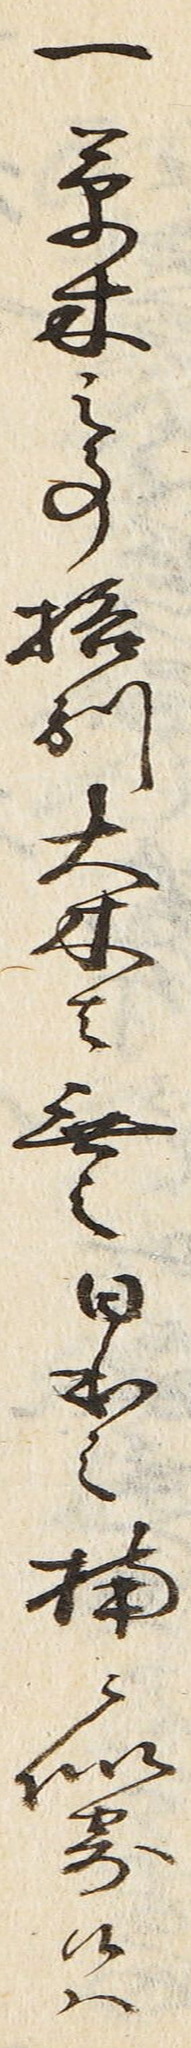一草木之事格別大木は無之日本の楠に似寄候は
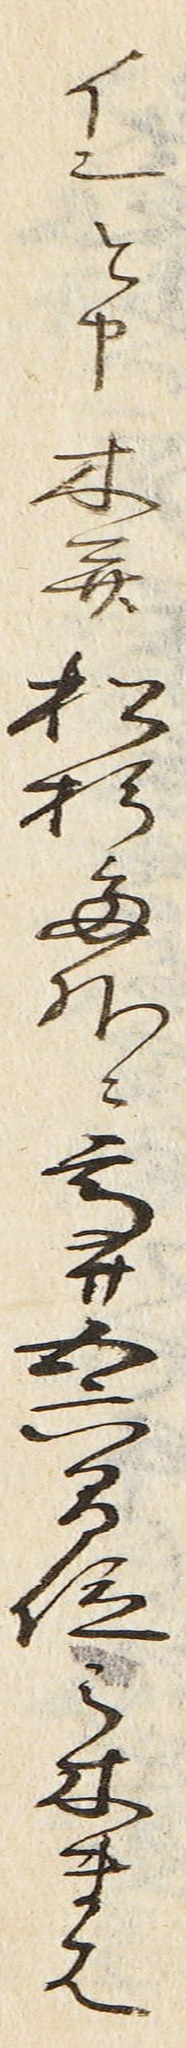インと申木并松杉多外に高さ五六間位之木まは
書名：土佐中浜万次郎漂流記
